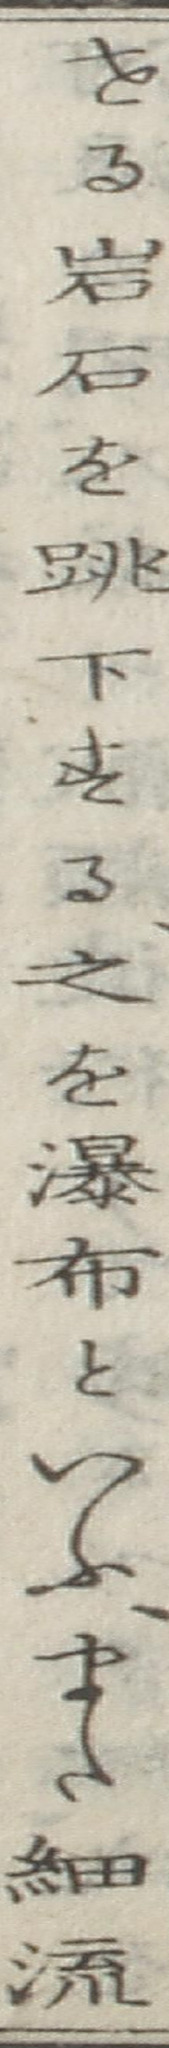せる岩石を跳下する、之を瀑布といふ、また細流
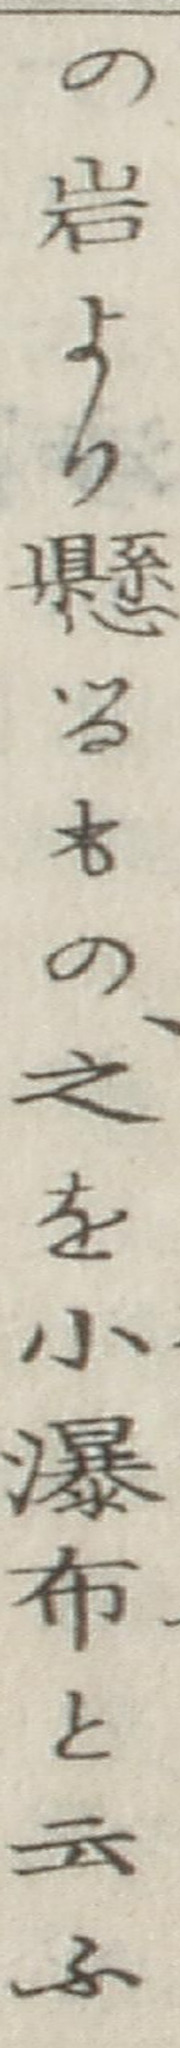の岩より懸るもの、之を小瀑布と云ふ
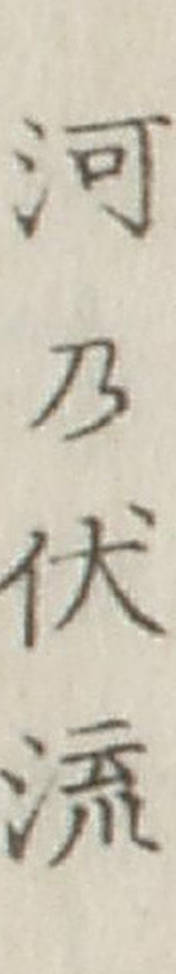河の伏流
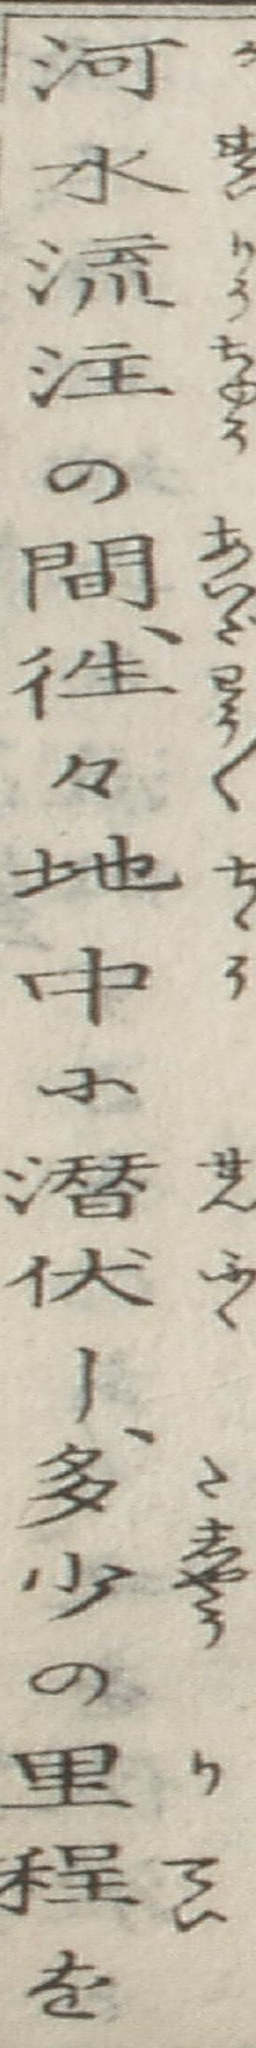河水流注の間、往々地中に潜伏し、多少の里程を

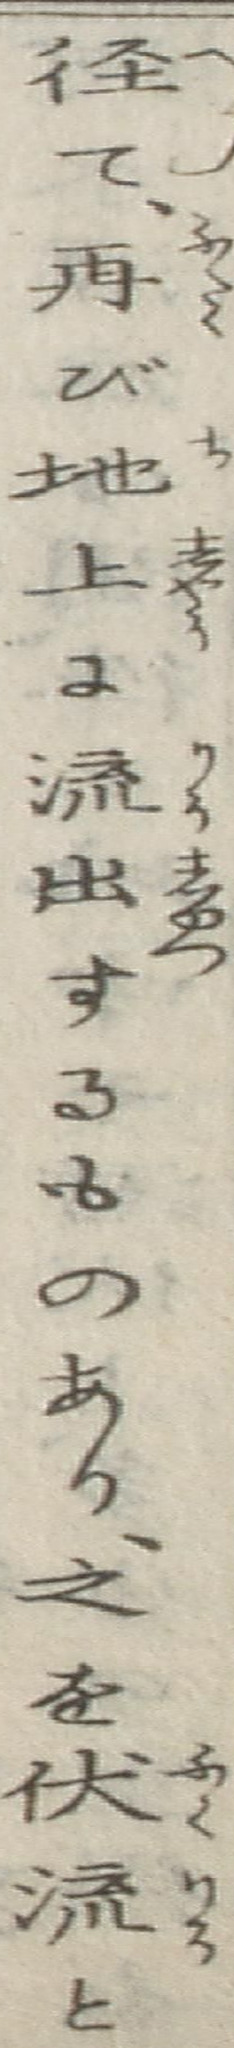経て、再び地上に流出するものあり、之を伏流と
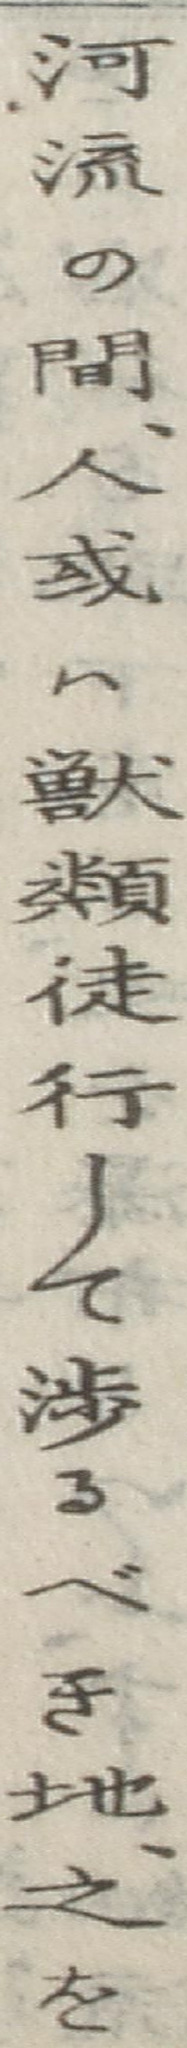河流の間、人或は獣類徒行して渉るべき地、之を
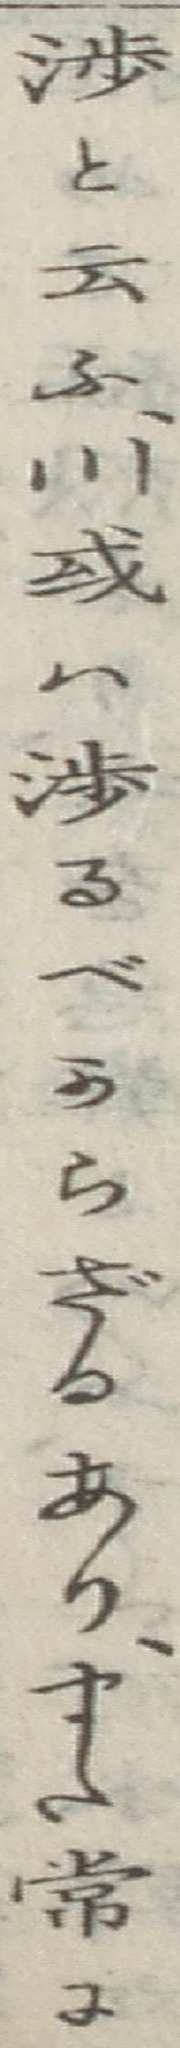渉と云ふ、川或は渉るべからざるあり、また常に
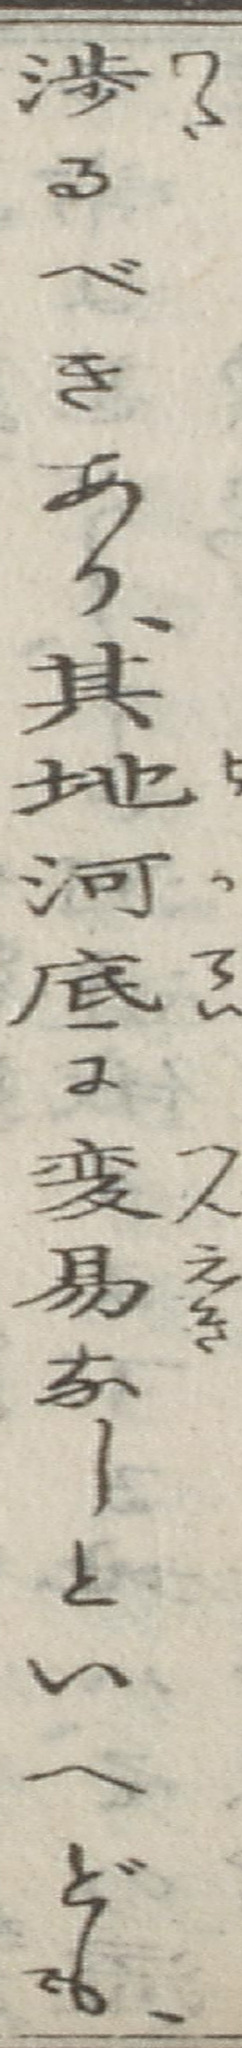渉るべきあり、其地河底に変易なしといへども、
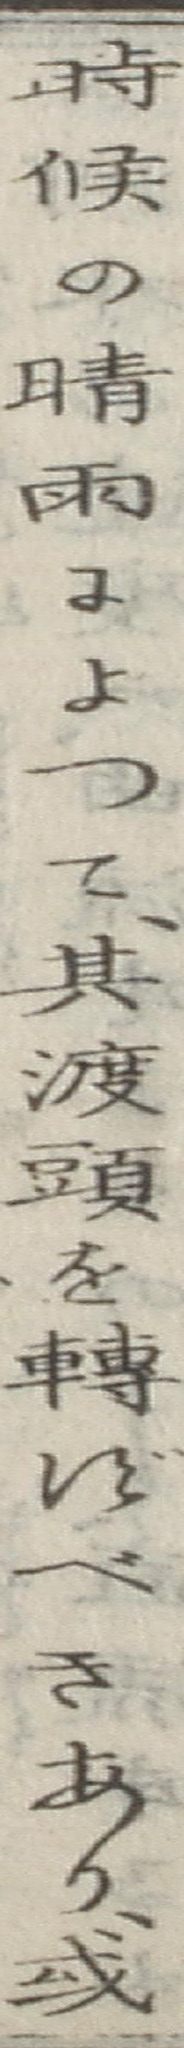時候の晴雨によつて、其渡頭を転ずべきあり、或
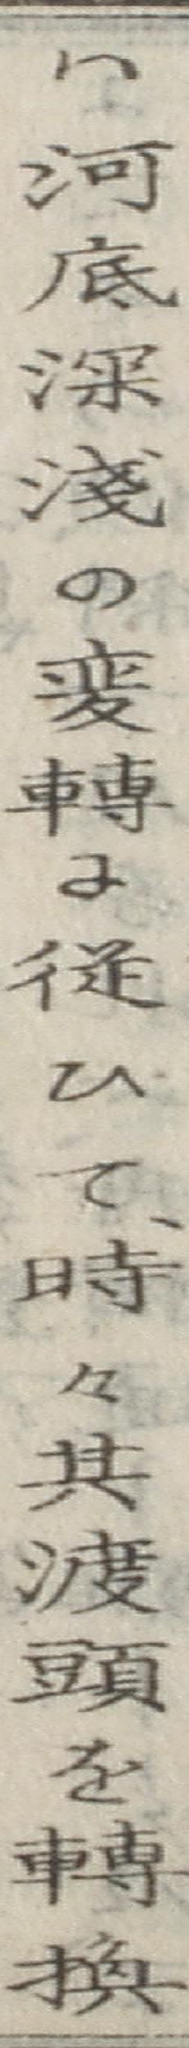は河底深浅の変転に従ひて、時々其渡頭を転換
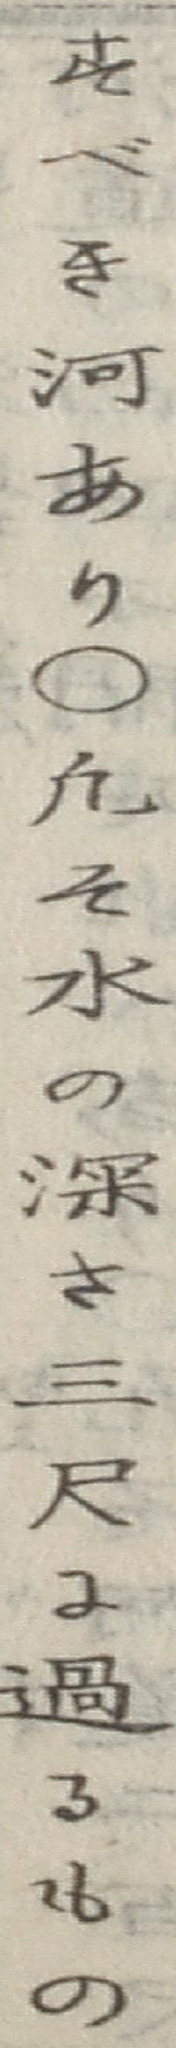すべき河あり〇凡そ水の深さ三尺に過るもの
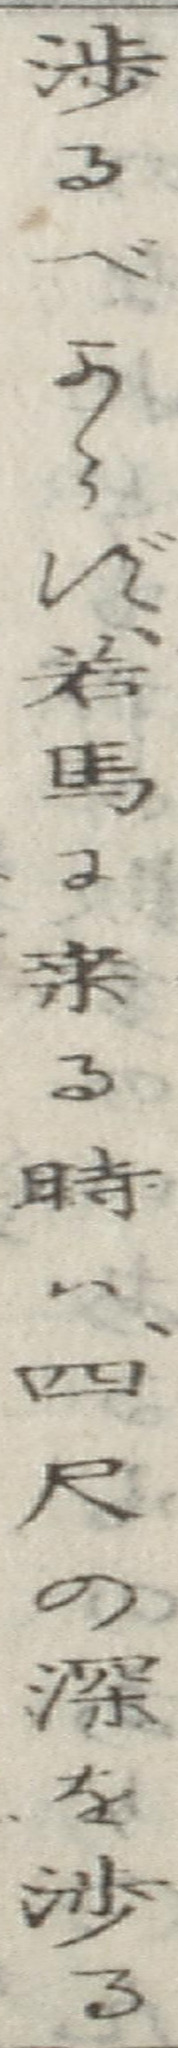渉るべからず、若馬に乗る時は、四尺の深を渉る
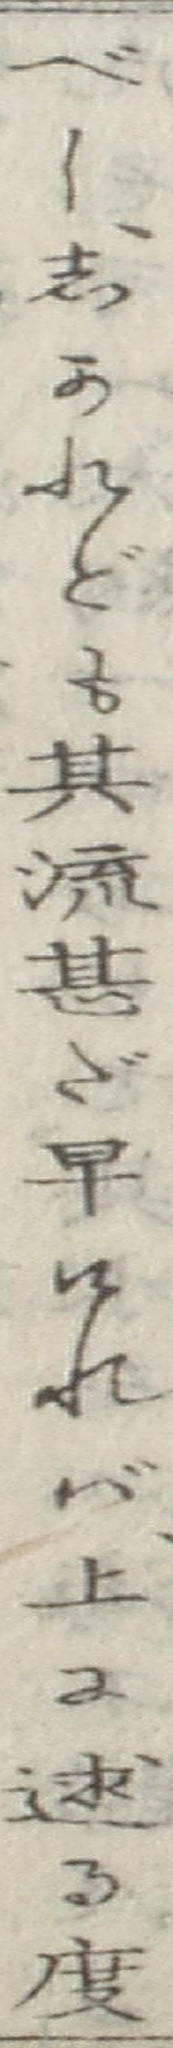べし、しかれども其流甚だ早ければ、上に述る度
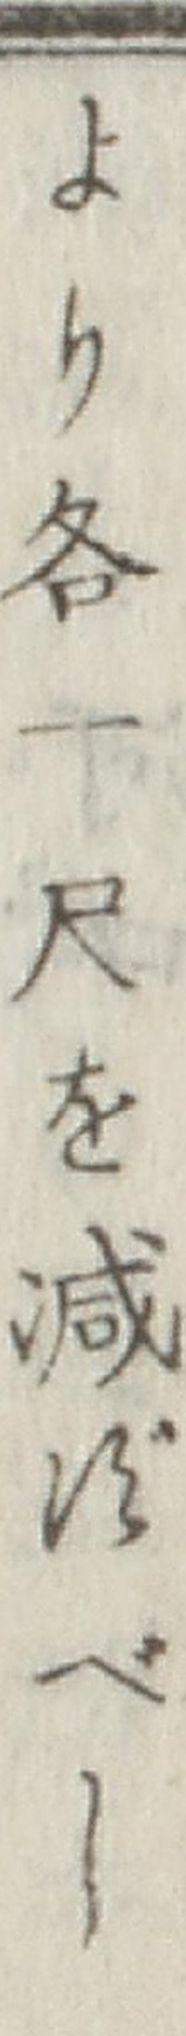より各一尺を減ずべし
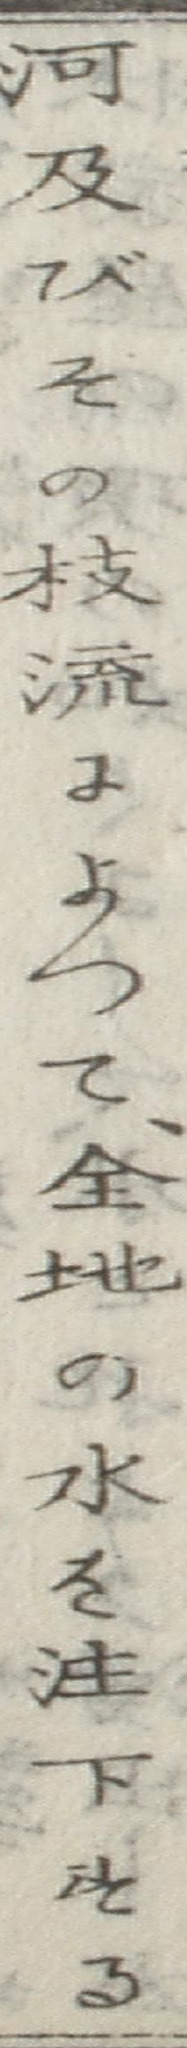河及びその枝流によつて、全地の水を注下する
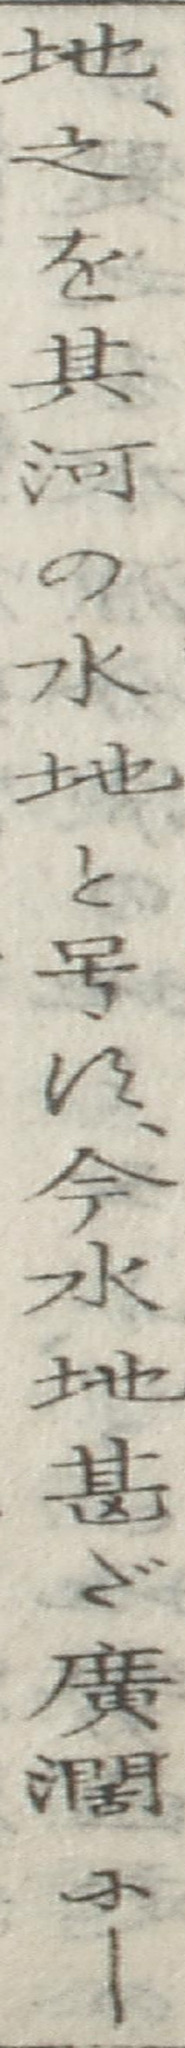地、之を其河の水地と号す、今水地甚だ広闊にし
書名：訓蒙　天然地理學　中
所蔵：東京大学地震研究所図書室 Earthquake Research Institute Library, The University of Tokyo, JAPAN
